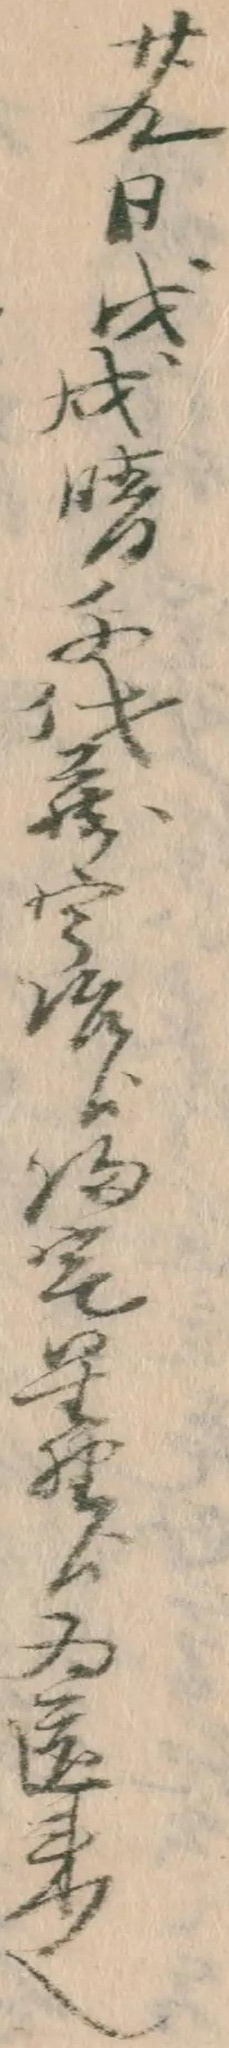廿九日戊戌晴千代蔵宇治ゟ帰宅星野ゟ為送来也
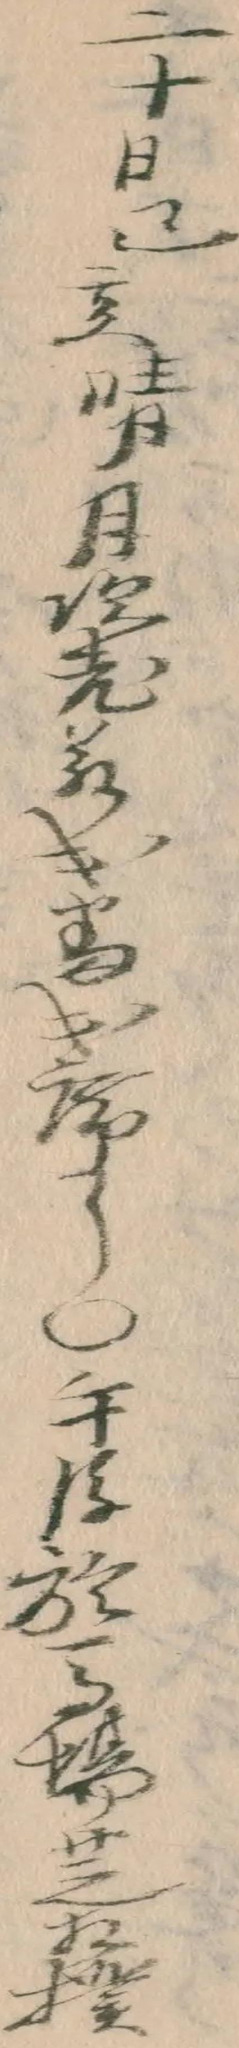三十日己亥晴月次老若出番出席了◯午後於馬場芝相撲
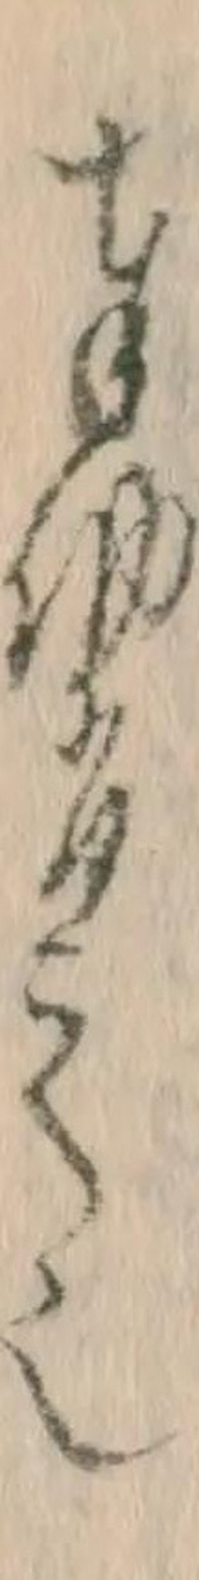奉納有之也
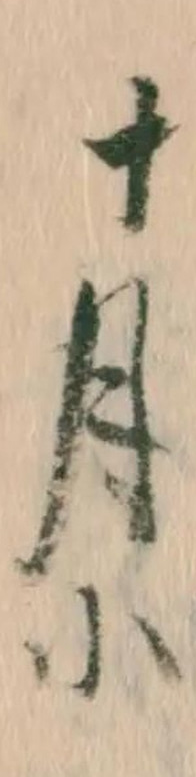十月小
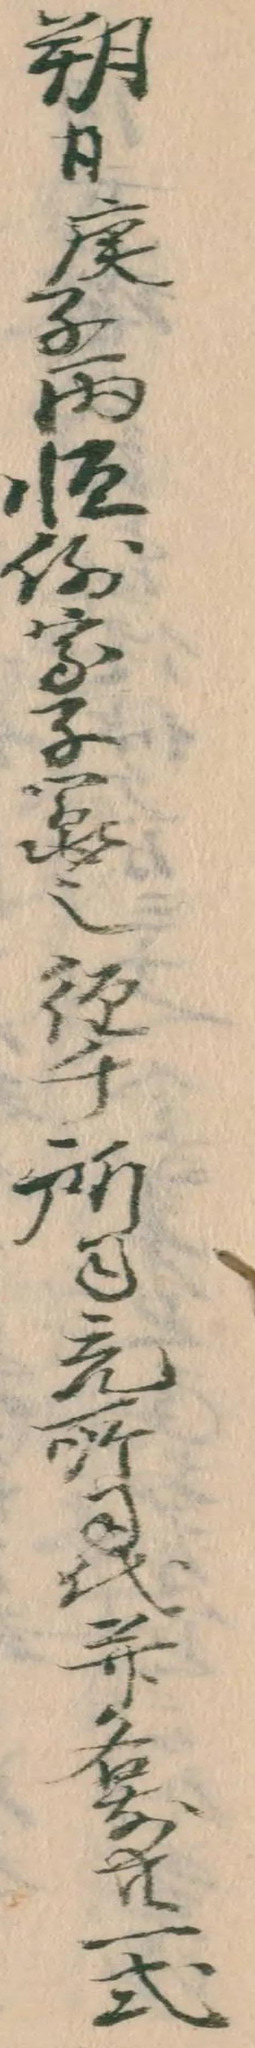朔日庚子両恒例家子鬮也経千所司充所司代并名前共一式
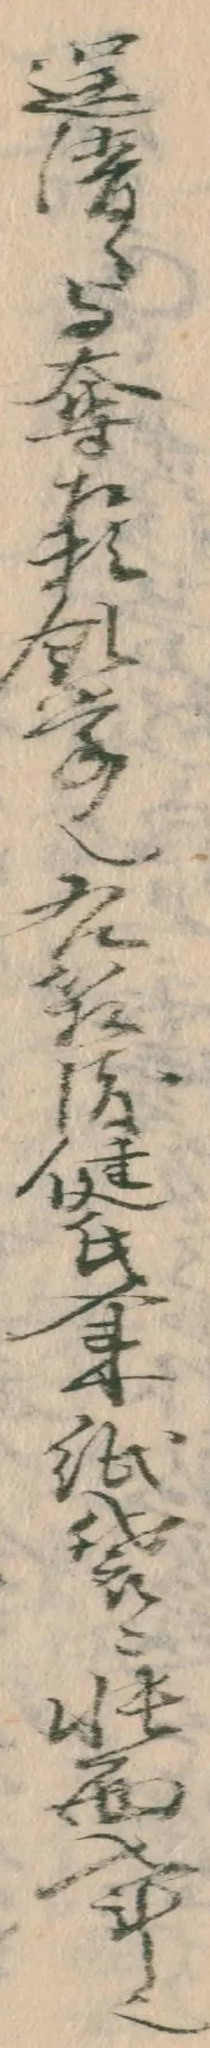逞清へ与奪相頼飢掌也右箱後健氏入来紙袋ニ帳面入斗也
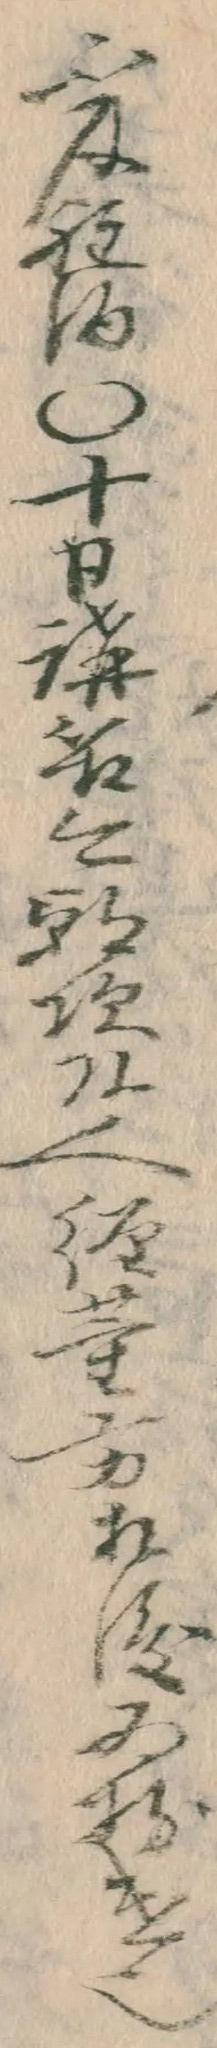不及程泊◯十日講節今朝次頭人経董方相渡為持遣也
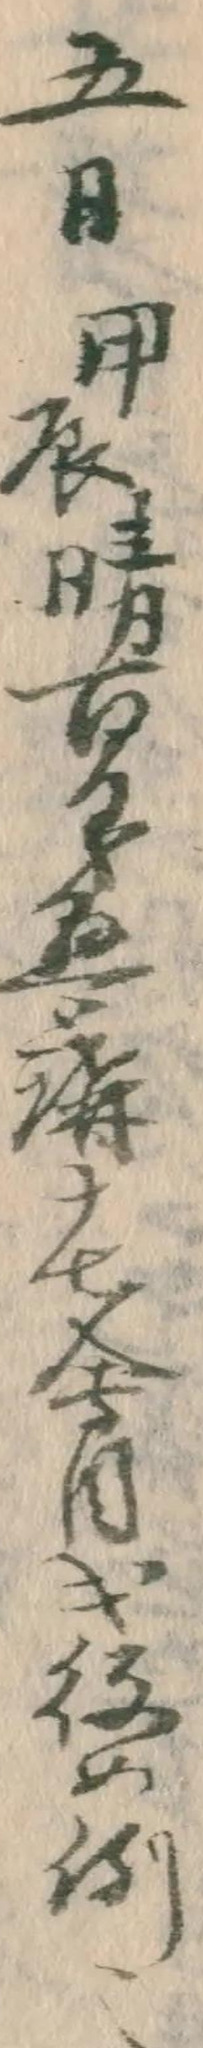五日甲辰晴百匁懸御講十七會目出役如例也
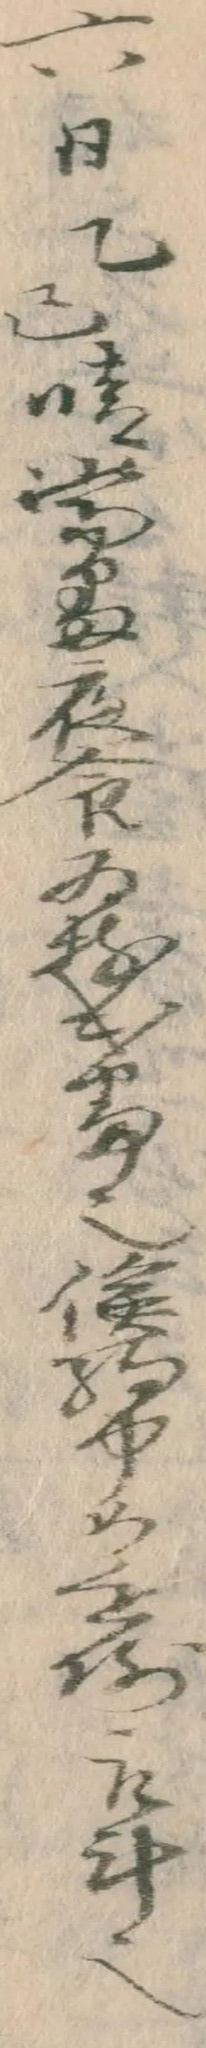六日乙巳晴當番夜食為持出番也倹約中被進例取斗也
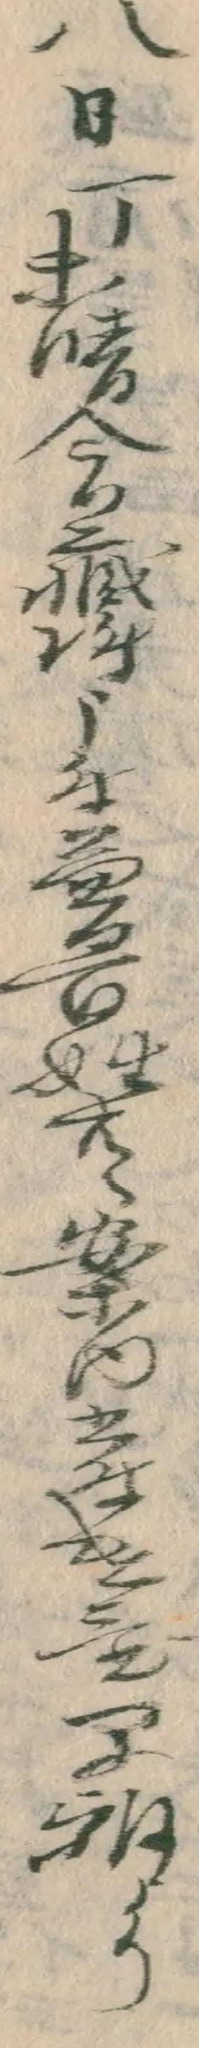八日丁未晴今日蔵附申付兼而百姓共へ案内書付遣置早朝より
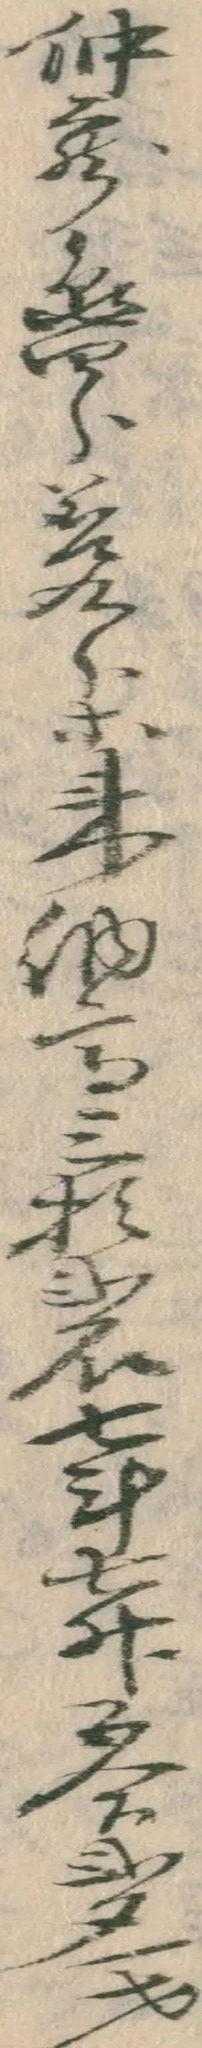仲蔵亀四郎差九郎等来納高三拾弐石七斗七升五合弐勺一才
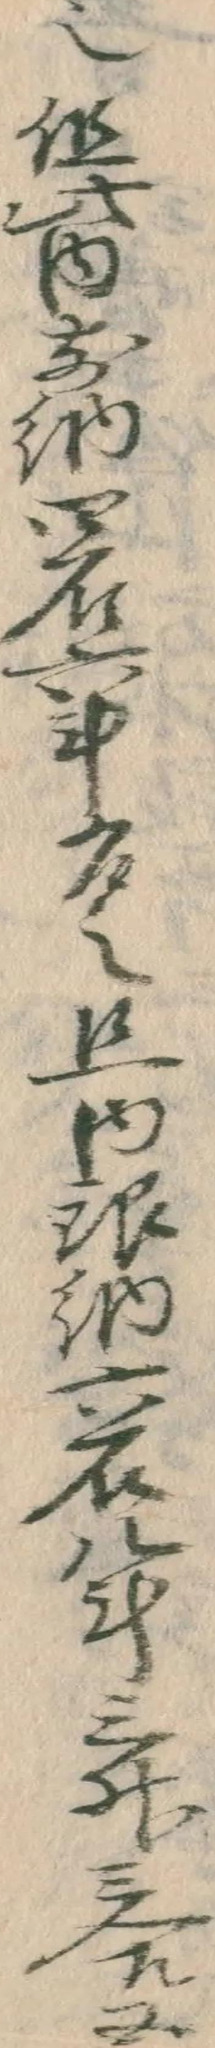也但此内前納四石六斗有之且内銀納六石八斗三升三合五
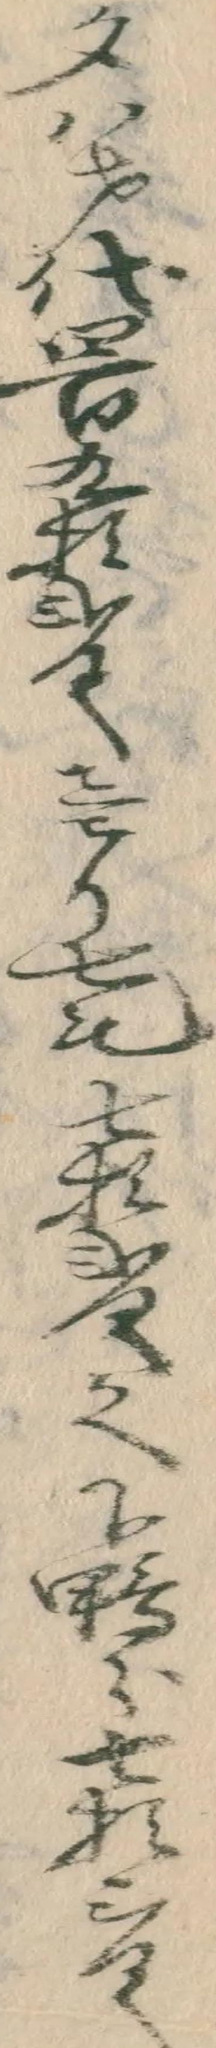夕ハ才代四百九拾弐匁壱リ七毛七拾弐人かへ下鴨分七拾三匁
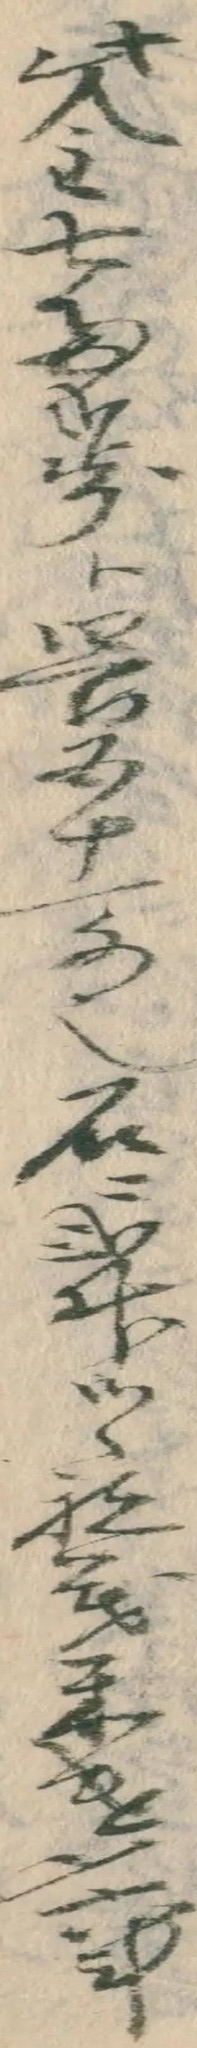此金七両弐歩ト四百五十一匁也石二弐升ツヽ程義米遣〆六斗
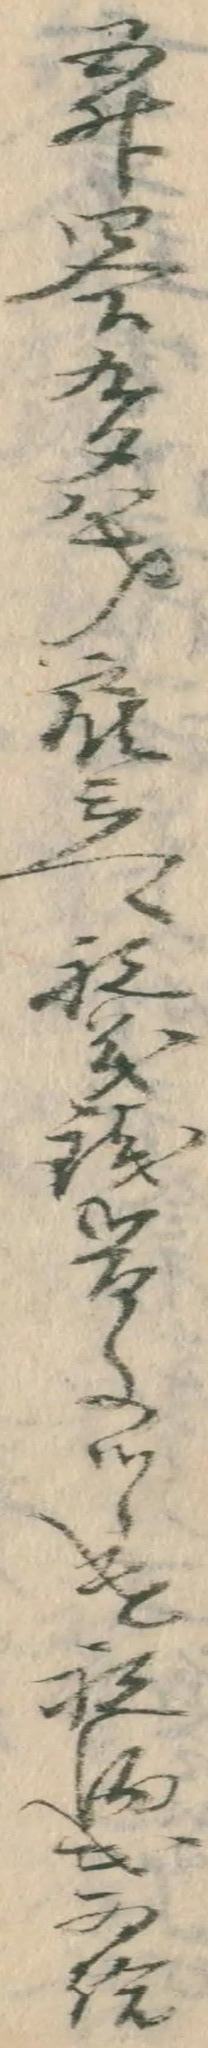五升四合九勺八才雇三人へ祝義銭弐百文ツゝ遣祝酒出為給
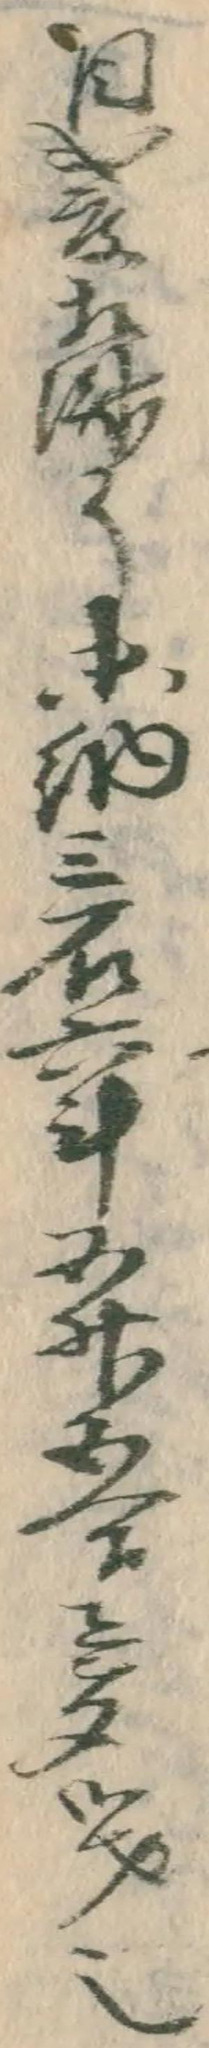目出度相済了未納三石六斗五升五合壱勺弐才也
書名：賀茂社記録. 第69冊
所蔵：国立国会図書館 National Diet Library, JAPAN
